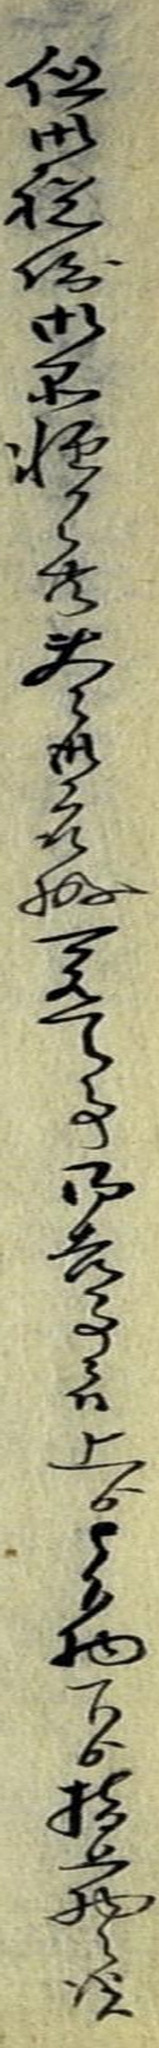但御祝儀御品軽く候共夫々御取扱可有之事御吉事に付上ゟ被下物下ゟ指上物之儀は
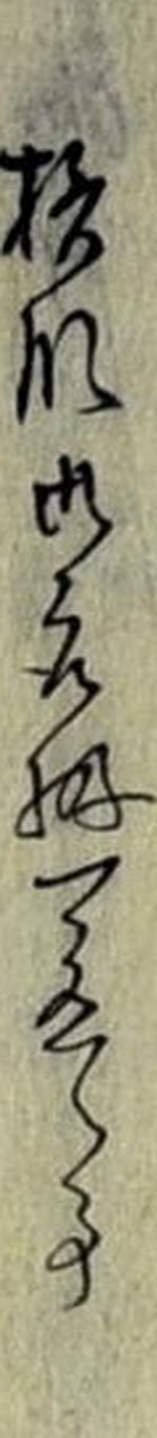格段御取扱可有之事
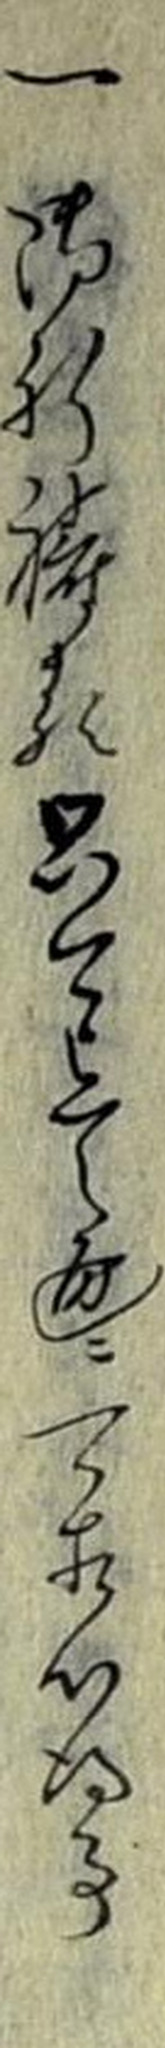一御祈祷類只今迄之通に可相心得事
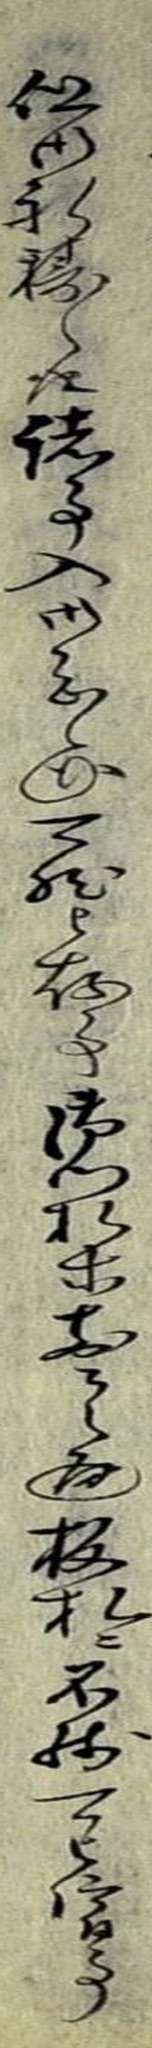但御祈祷之儀諸事入御念候趣可然被存事御門札等前々之通板札に不残可被仰付事
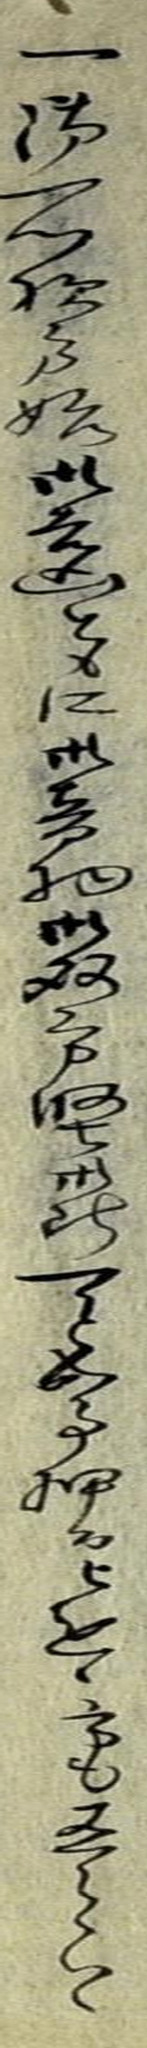一御一門様方始御吉凶ともに御音物御双方堅御断可被成事押而被進候方も有之候はゝ
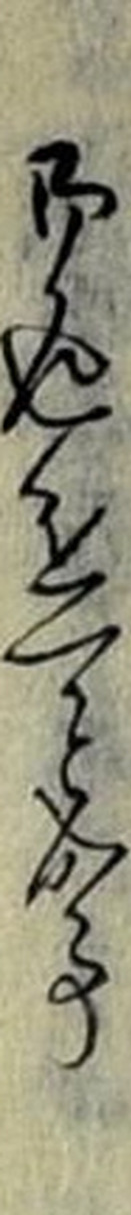御返進可被成事
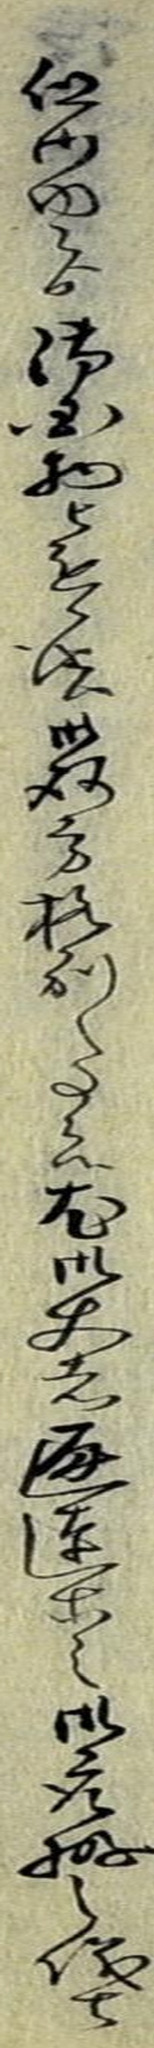但御内々ゟ御国物被進候儀は御双方格別之事に候尤御使者通達等之御取扱之儀は
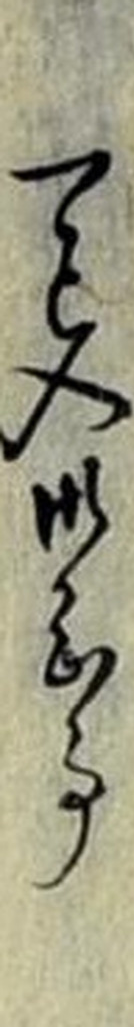可被入御念事
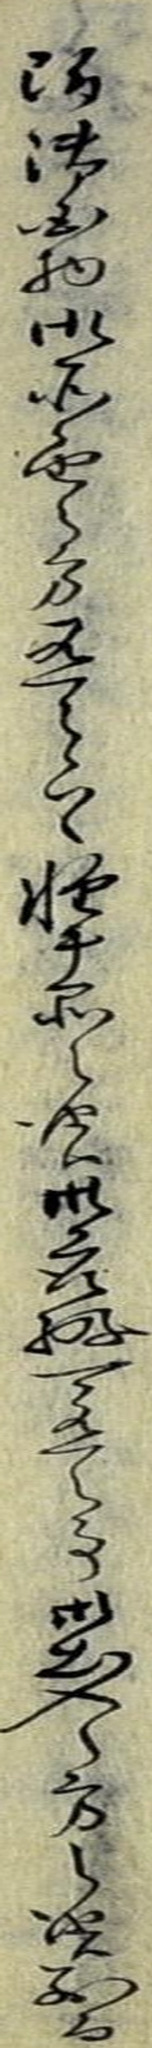附御国物御所望之方有之候はゝ軽き品之儀は御取扱可有之事御出入之方之儀は別而
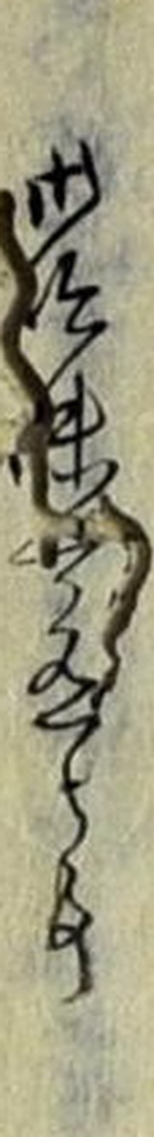御吟味可有之事
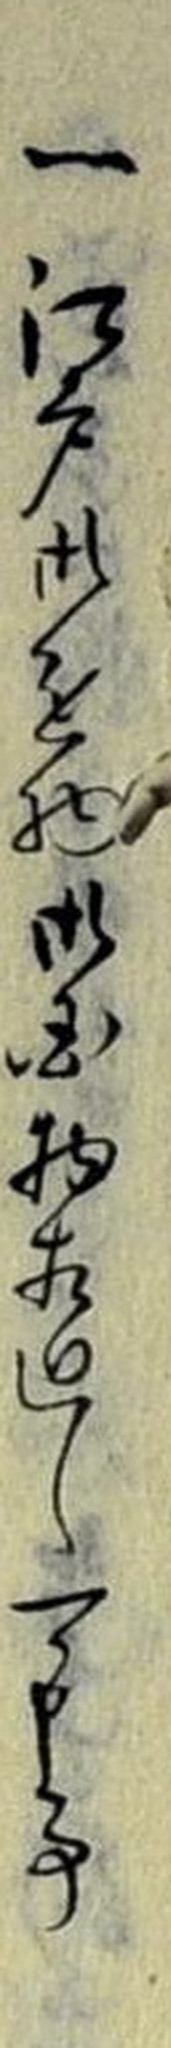一江戸御進物御国物相廻し可申事
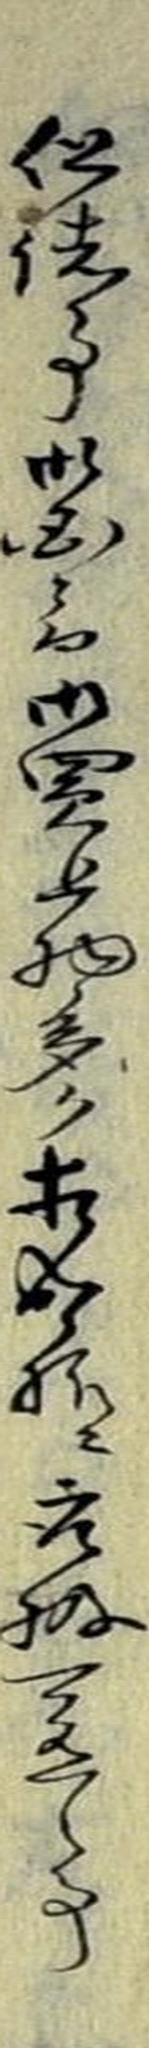但諸事御国に而御買上物多く相成様に取扱可有之事
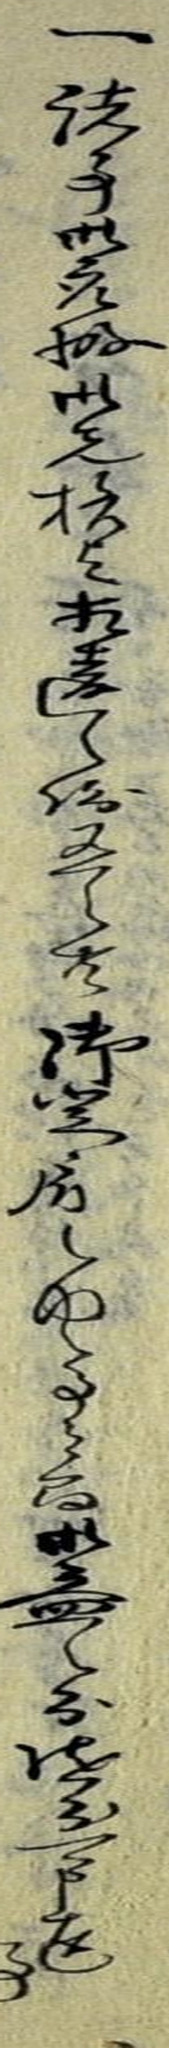一諸事御取扱御先格と相違之儀有之共御定府之内之事に候間御益之分随分可申達事
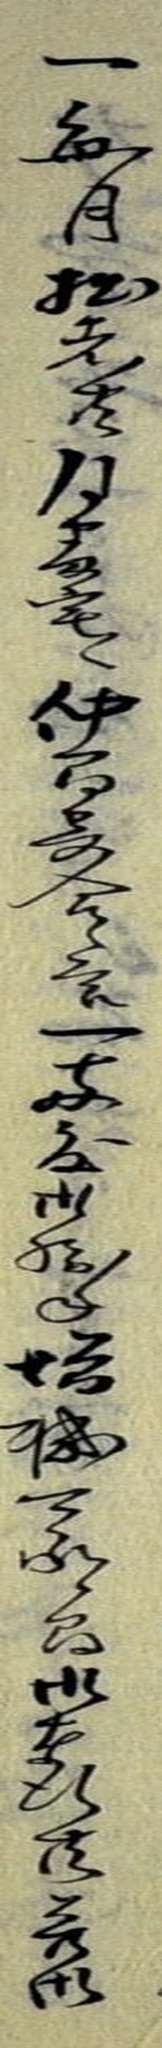一毎月拙者共月番宅へ仲間寄合候節一両度御勝手増減可承候間御奉行共并御
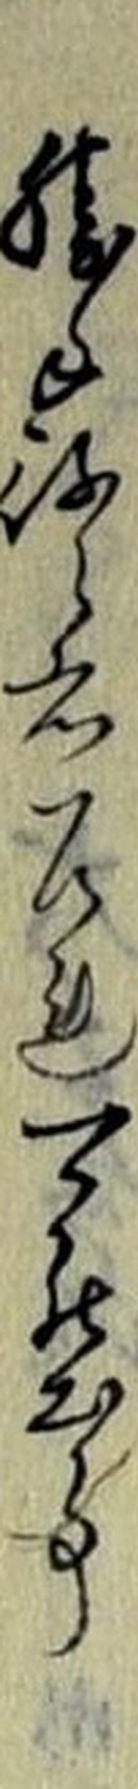勝手役之者召連可罷出事
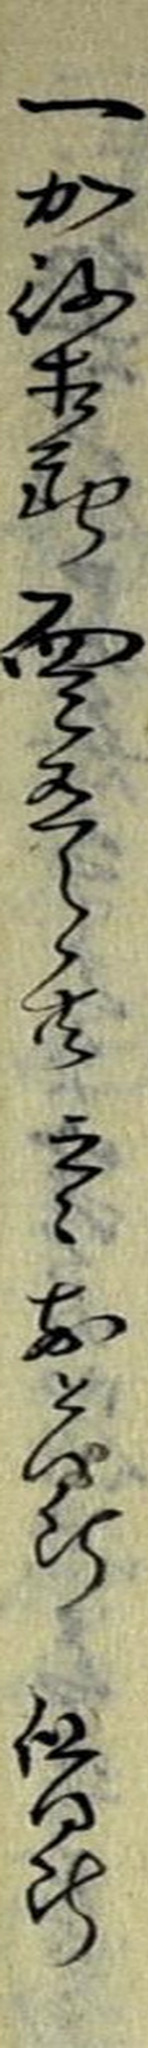一加役相勤候面々有之候共云々前と同断但同断
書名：命令之部 二
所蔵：福井県文書館 Fukui Prefectural Archives
